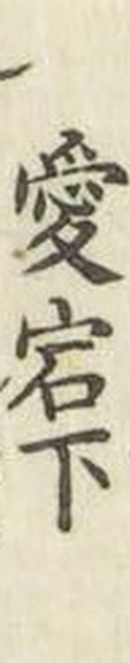愛宕下
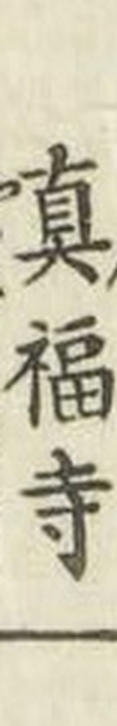真福寺
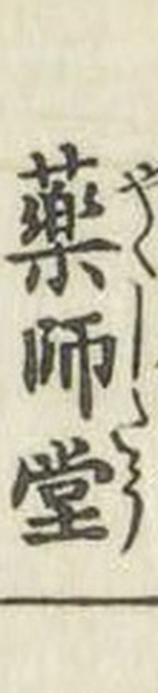薬師堂
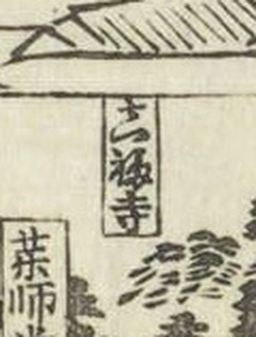真福寺
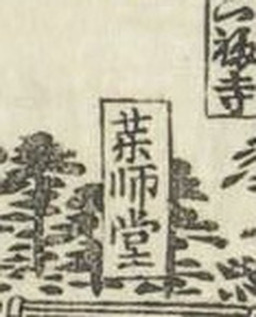薬師堂
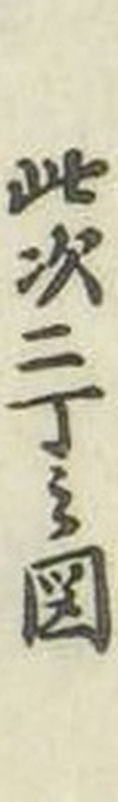此次二丁之図
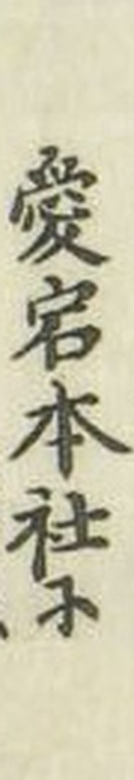愛宕本社に
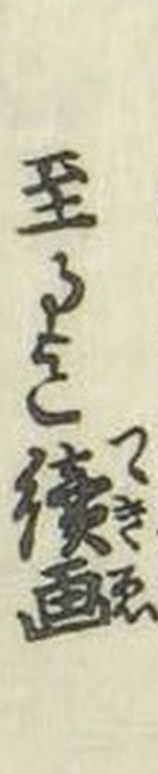至る迄續画

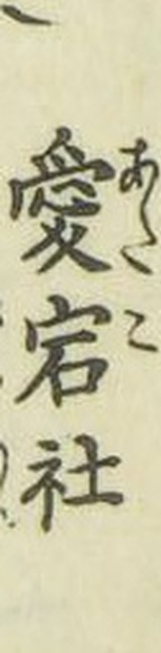愛宕社
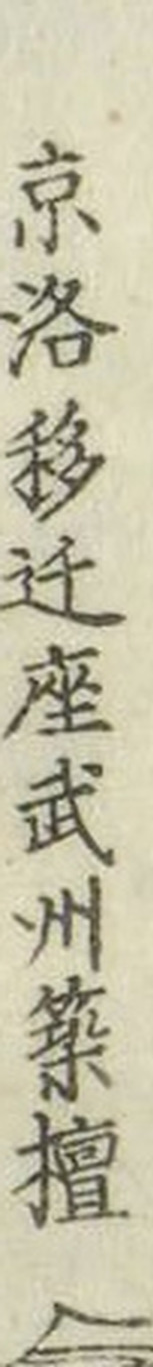京洛移遷座武州築檀
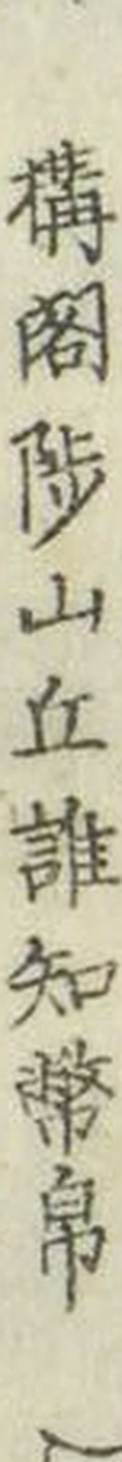構閣陟山丘誰知幣帛
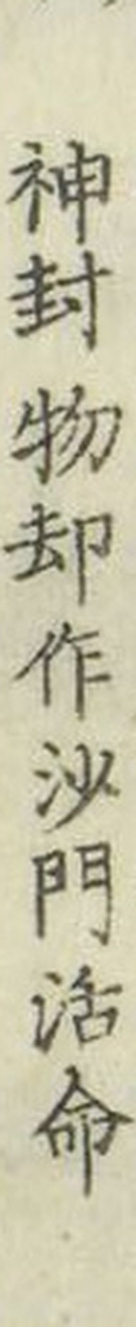神封物却作沙門活命
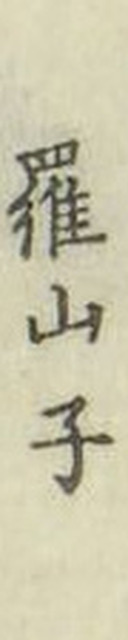羅山子

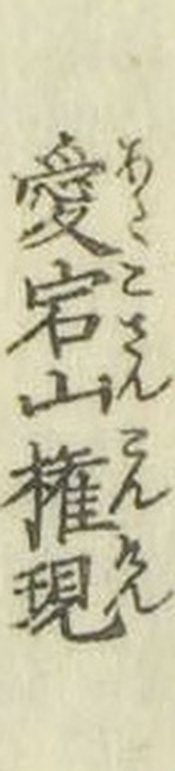愛宕山権現
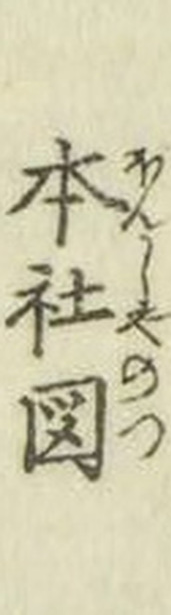本社図
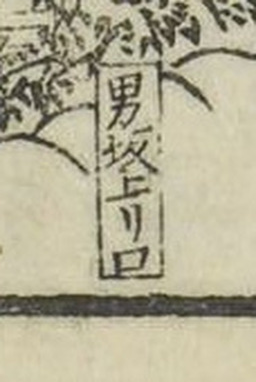男坂上り口
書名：江戸名所図会 20巻 巻之3
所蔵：東京学芸大学教育コンテンツアーカイブ
